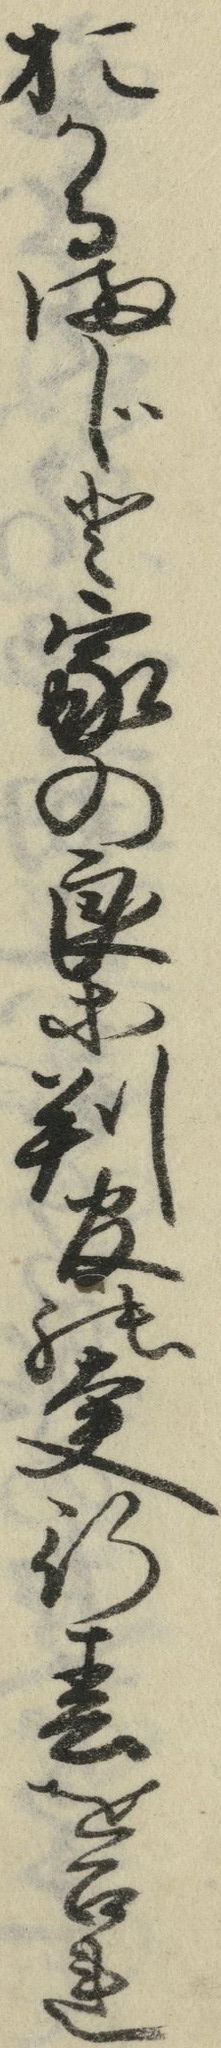おかるまじと家の良等判官の大夫行春を召連
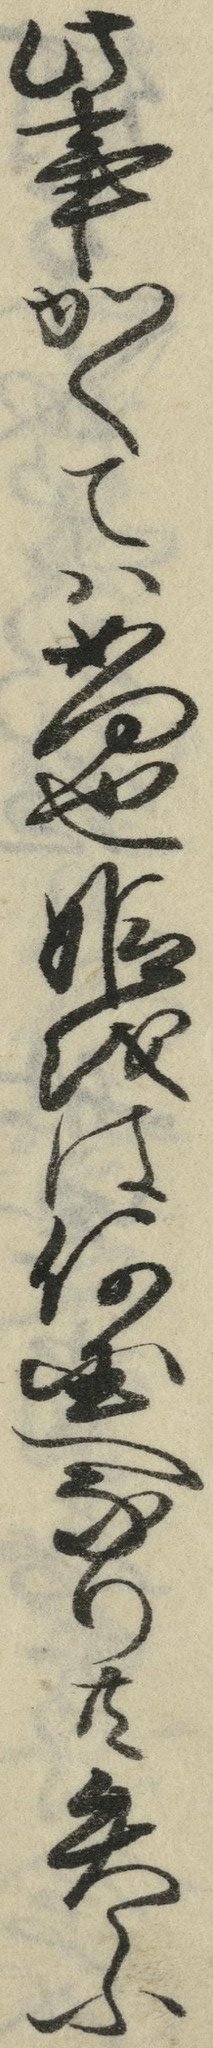此事かくてハ如何也姫をは何国へなり共失ふ
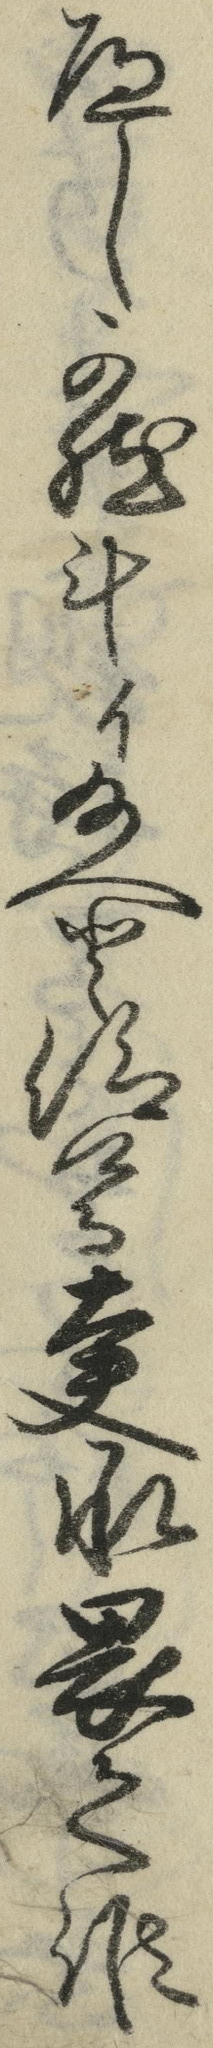へし可然斗リ給へと仰ける大夫承畏て候
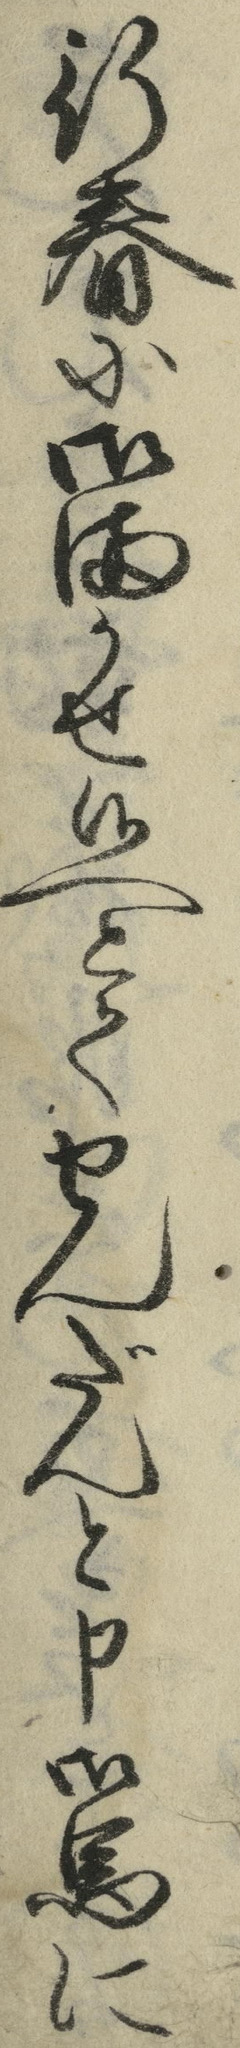行春に御まかせ候へとてせんだんと申御馬に

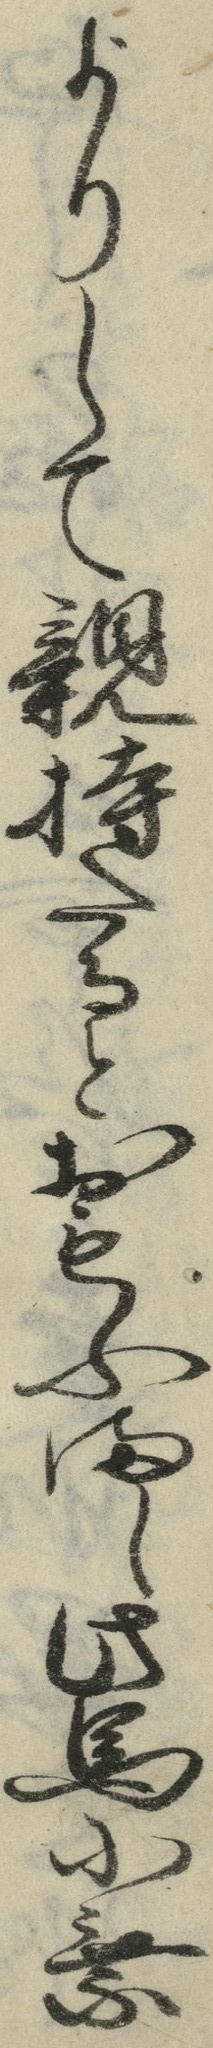よりして親持たるとおもふまし此馬に乗
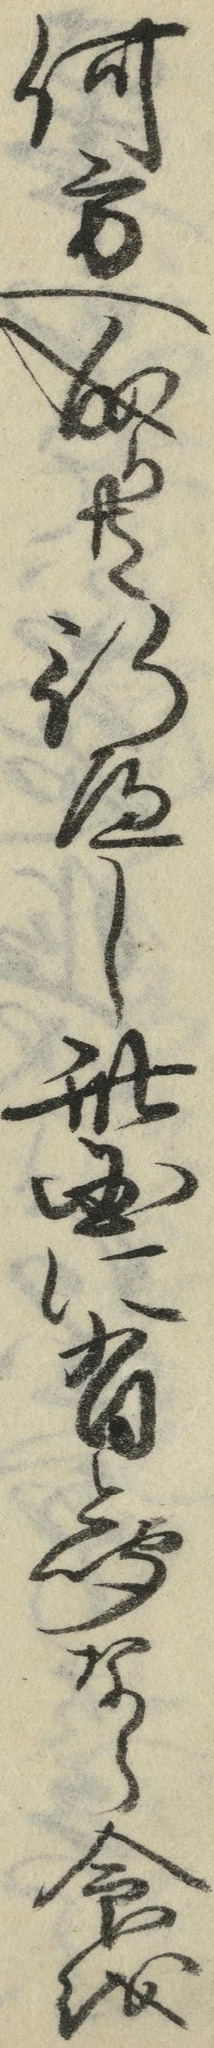何方へ成リ共行へし此国に有と聞なら命を
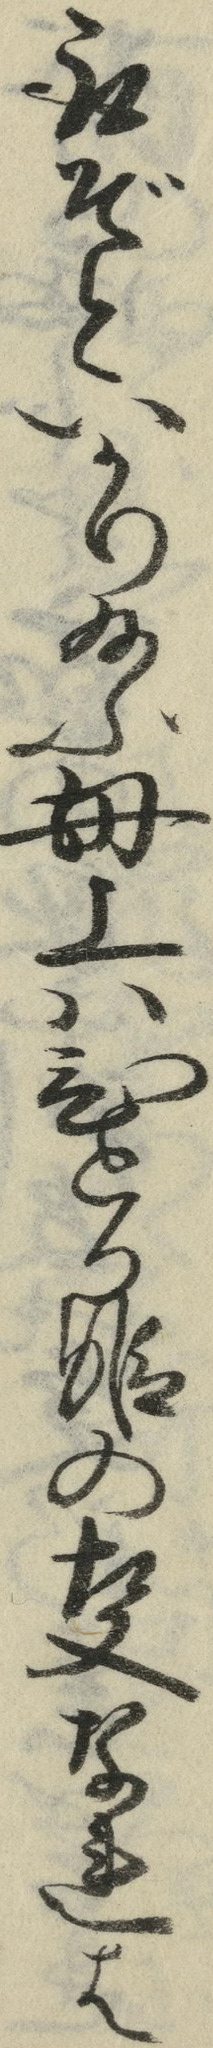取ぞといかり給ふ母上はひとり姫の事なれは
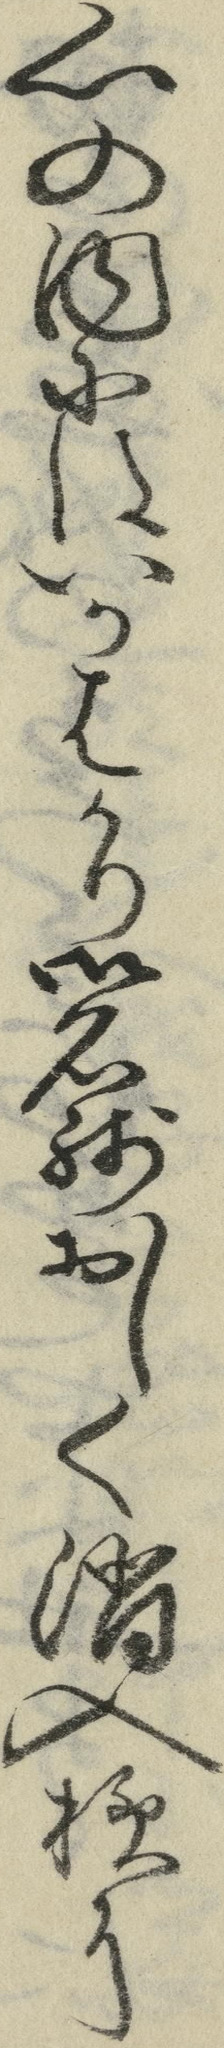心の内にはいかはかり御名残おしく消入様に
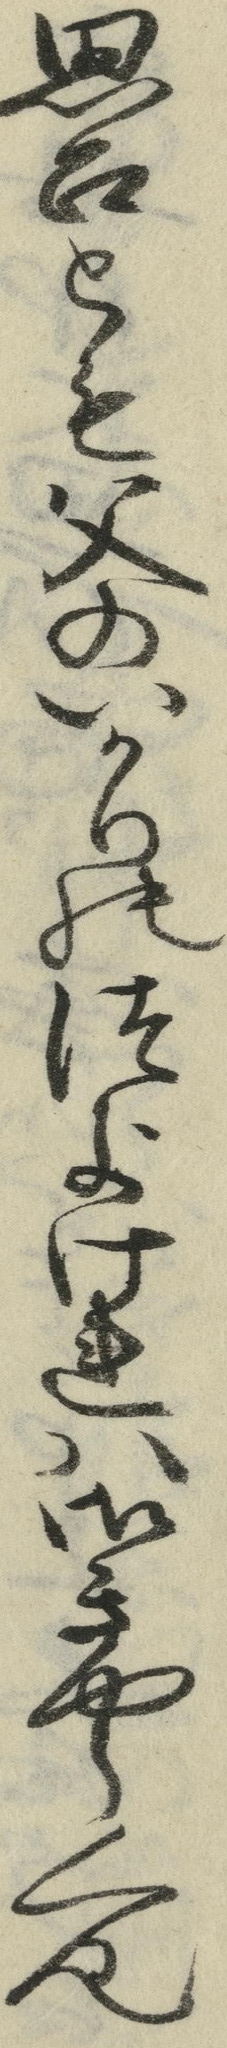思召とも父のいかりのつよけれは御きやうくわん
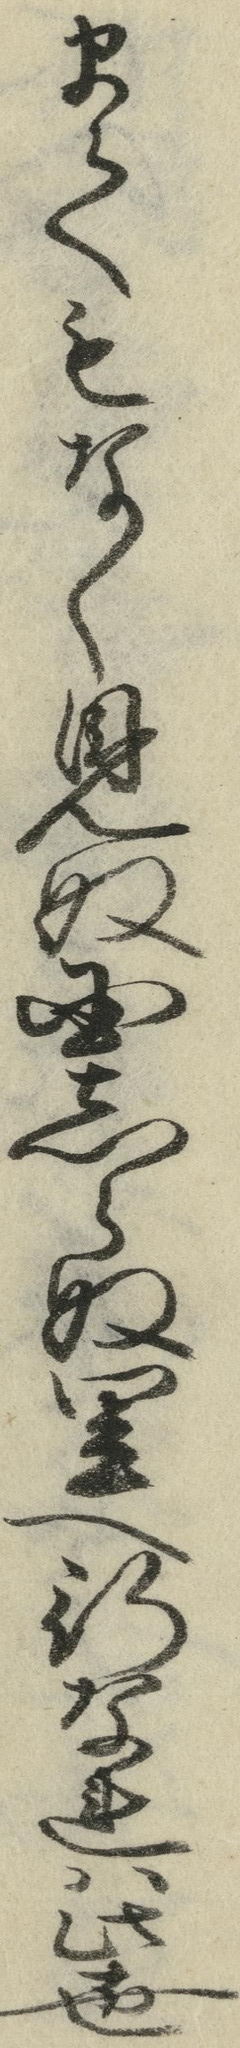まてもなく見ぬ国しらぬ里へ行なれは此世
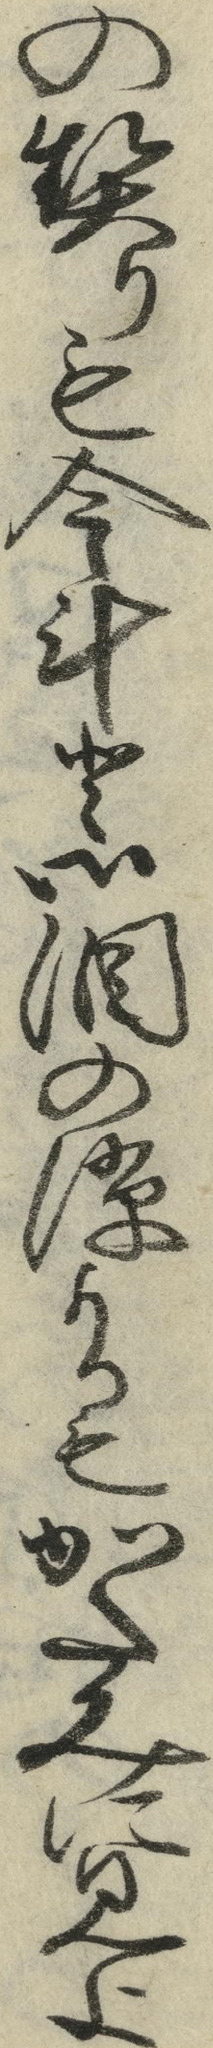の契今斗と御泪の隙よりもかたみに見よ
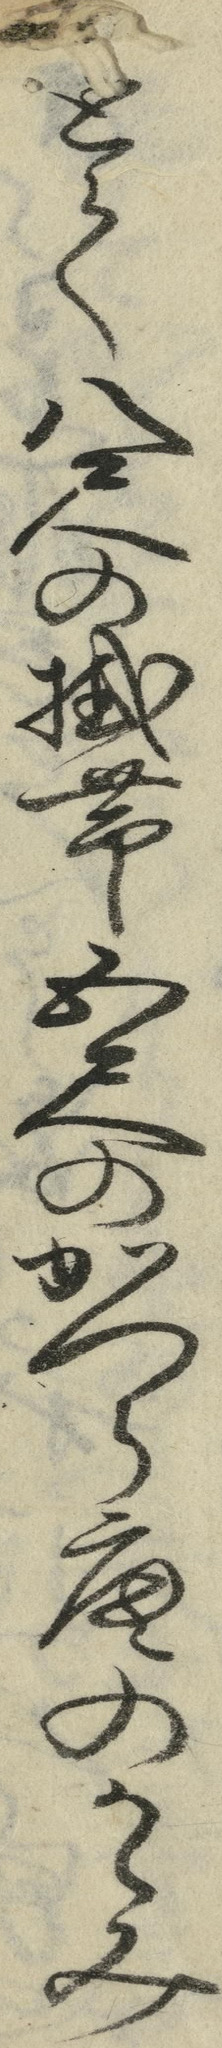とて八尺の掛帯五尺のかつら唐のかゝみ
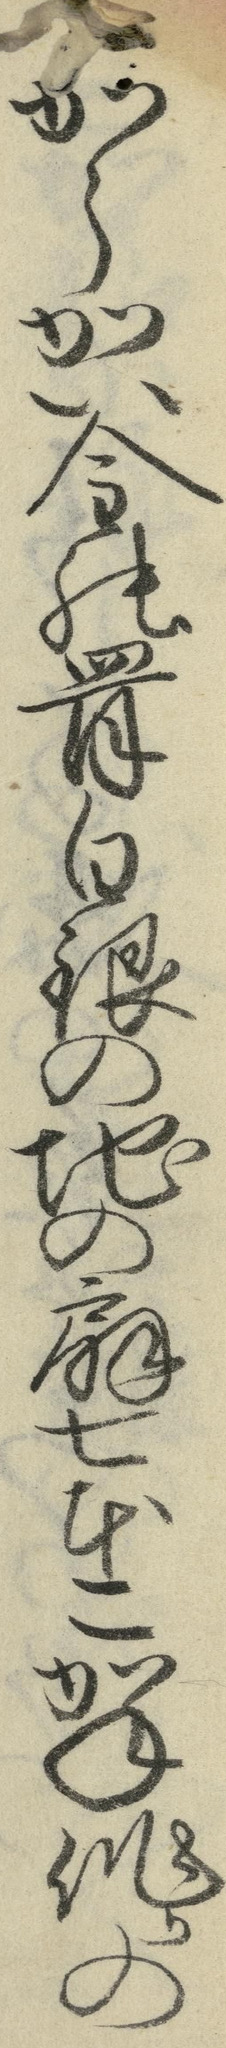かうかい金の骨白銀の地の扇七本こかね作
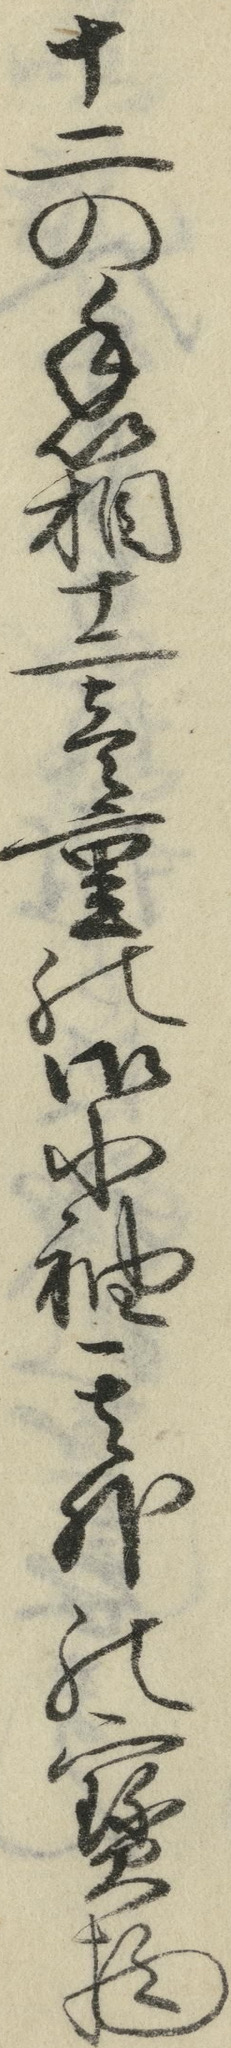十二の手箱十二壱重の御小袖其外の宝物
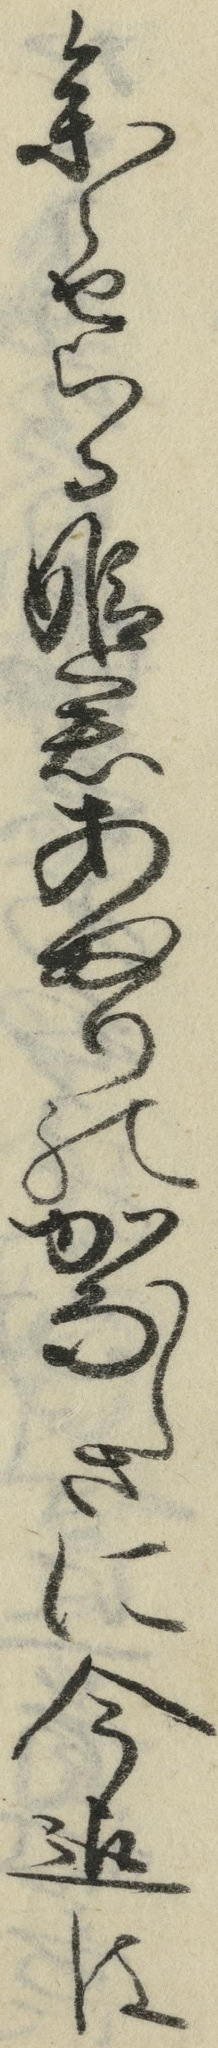参らせらる姫君あまりのかなしさに今迄は
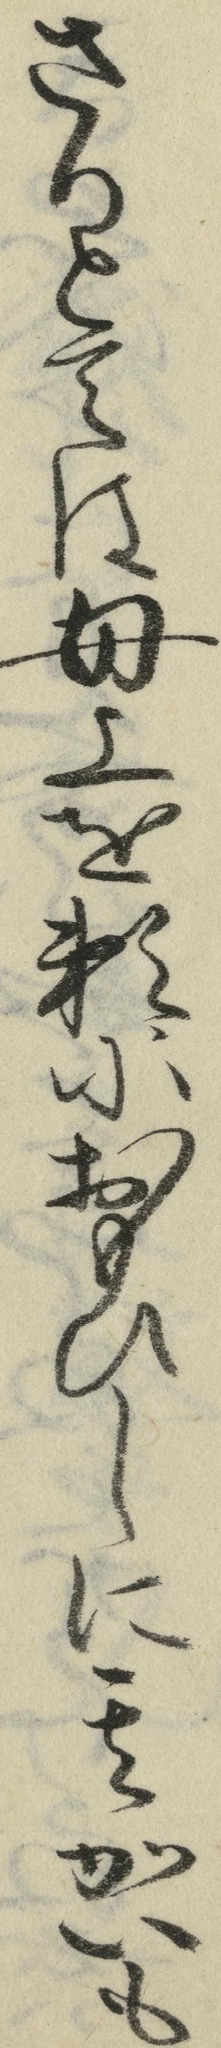さりとては母上を頼におもひしに其かいも
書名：浅間記
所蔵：東京大学地震研究所図書室 Earthquake Research Institute Library, The University of Tokyo, JAPAN
